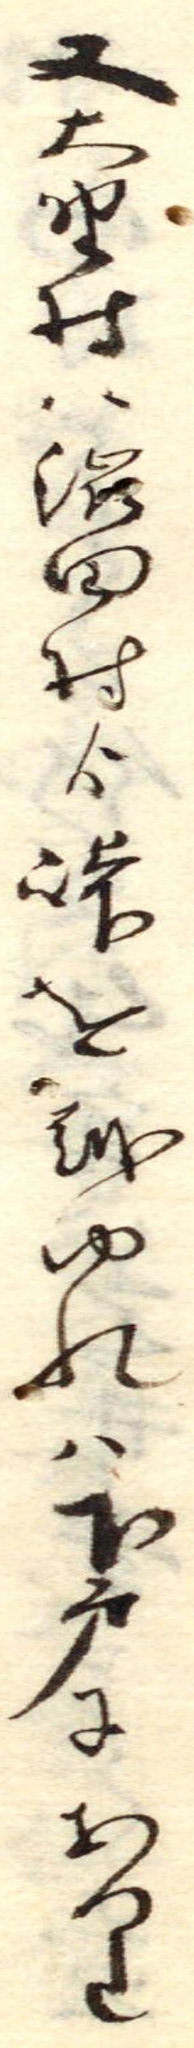又大野村は渋田村ゟ峠を越ゆれは下戸にあり
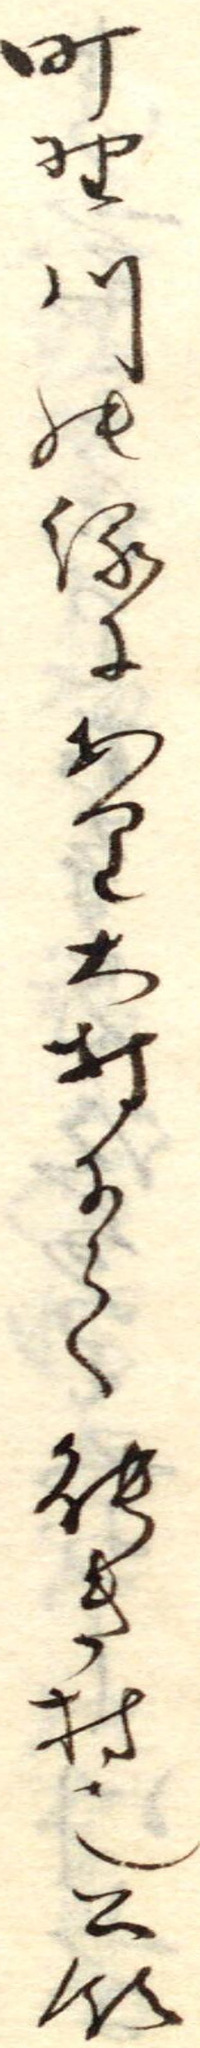町野川の縁にあり大村にてよき村也公領
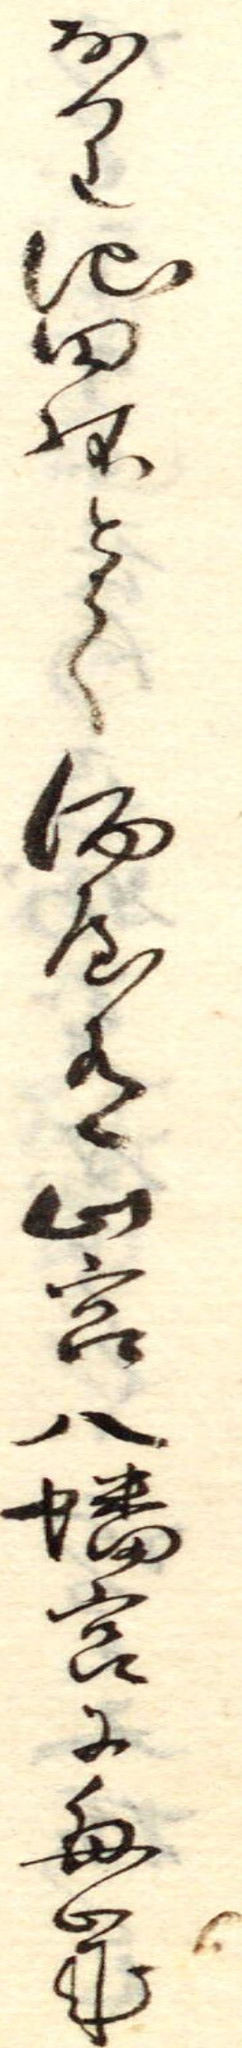なり池田抔とて酒屋有此宮八幡宮に毎歳
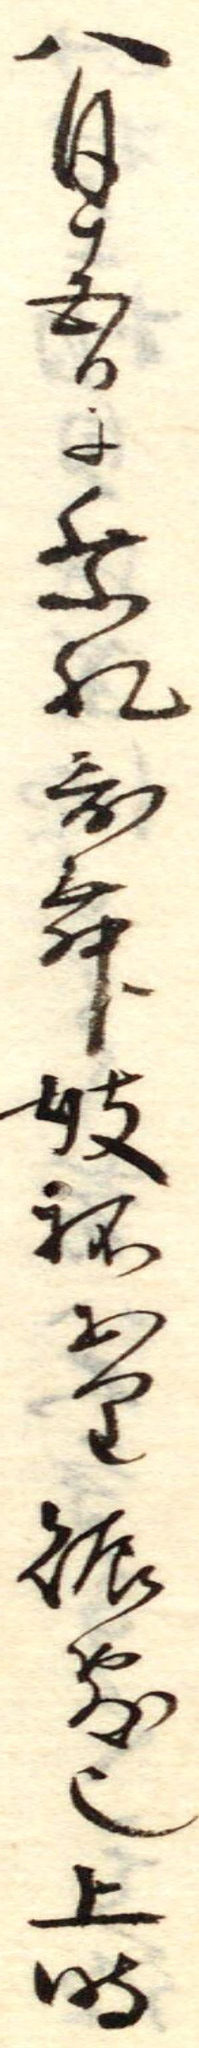八月五日に祭礼哥舞伎抔あり賑敷也上時
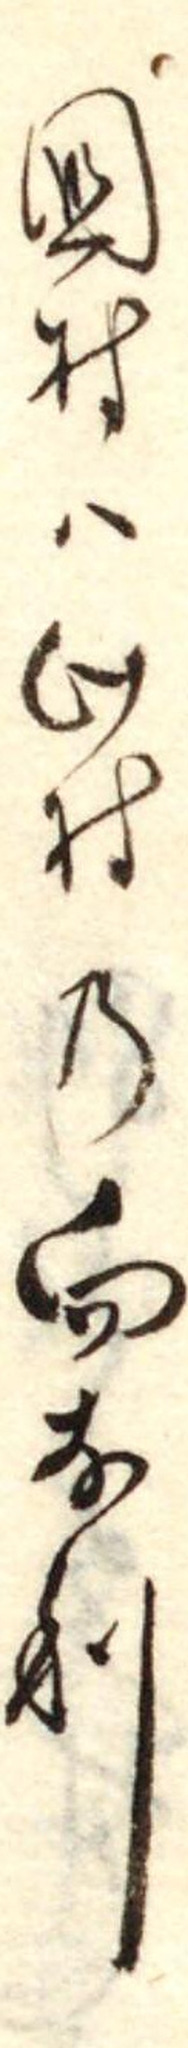国村は此村の向なり

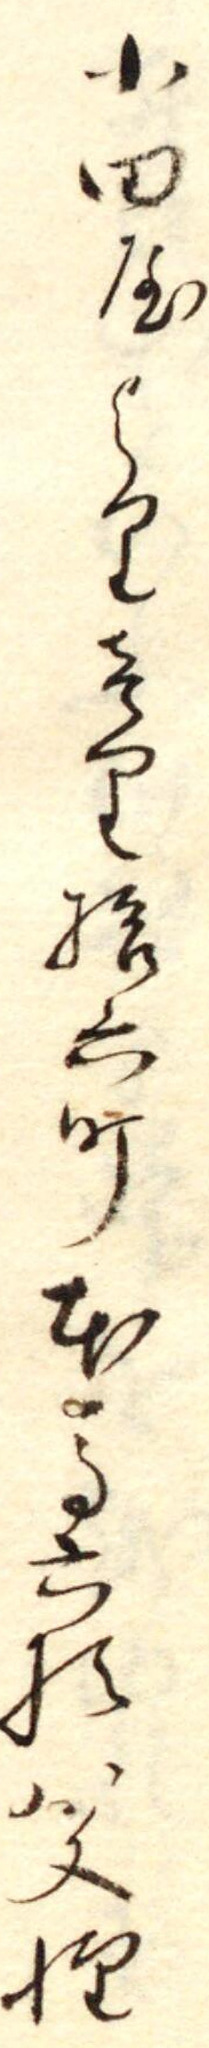小田屋より壱里拾六町本馬六拾八文軽
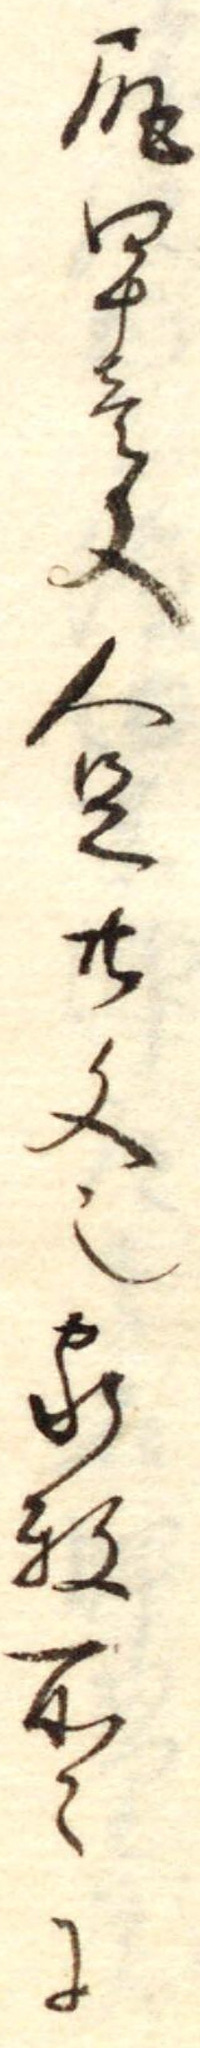川西尻四十壱文人足廿文也家数所々に
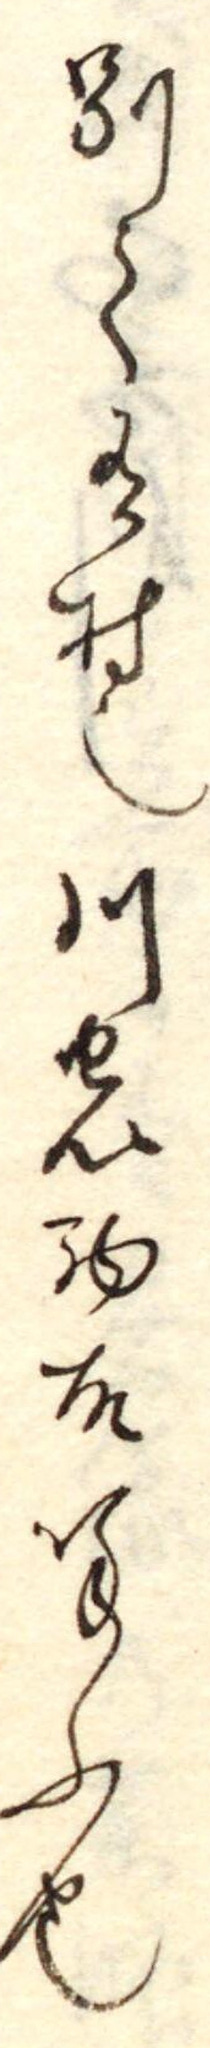別て有村也川の西故呼ふ也
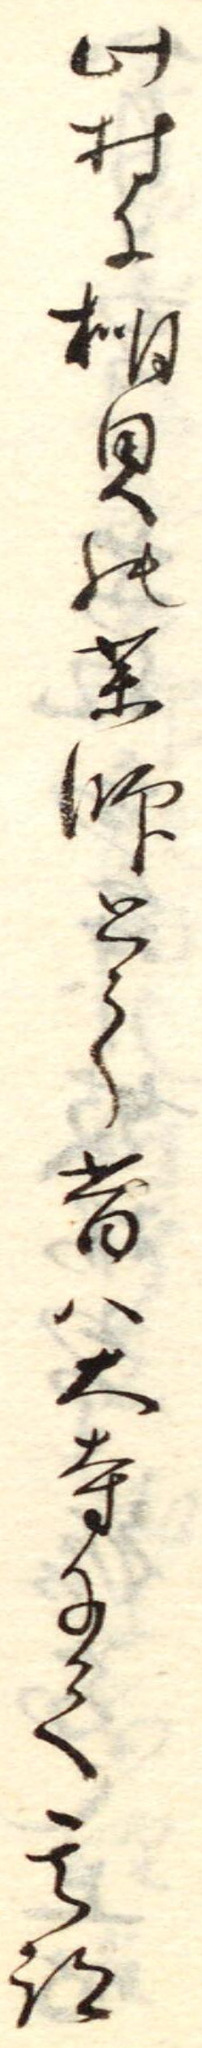此村に棚貝の薬師とて昔は大寺にて其跡
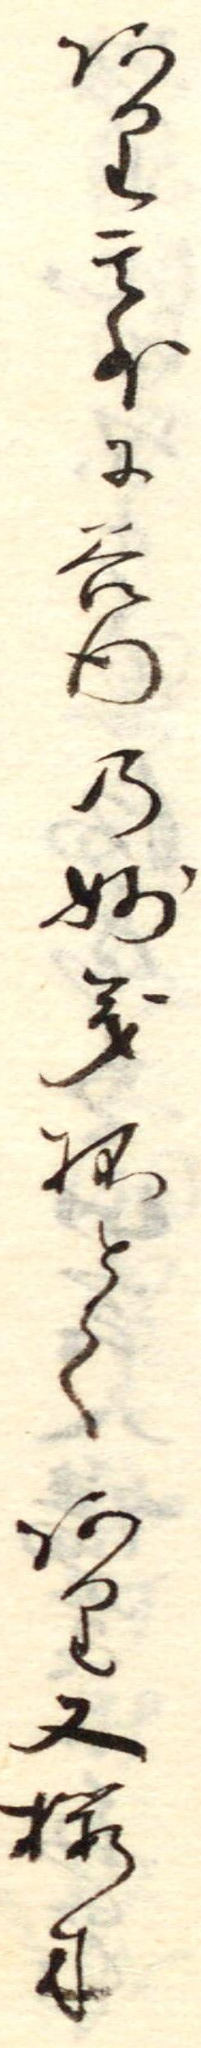あり其外に谷内の妙義抔とてあり又桜木
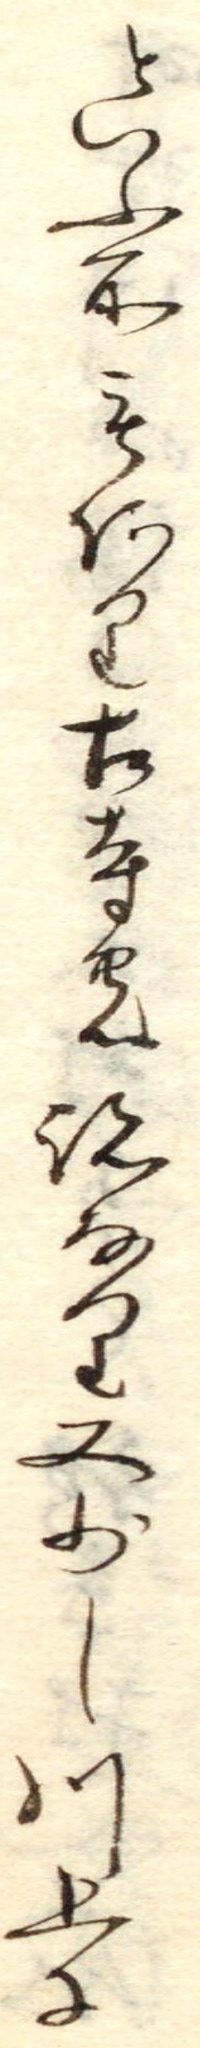といふ所もあり古寺の跡なり又少し川上に
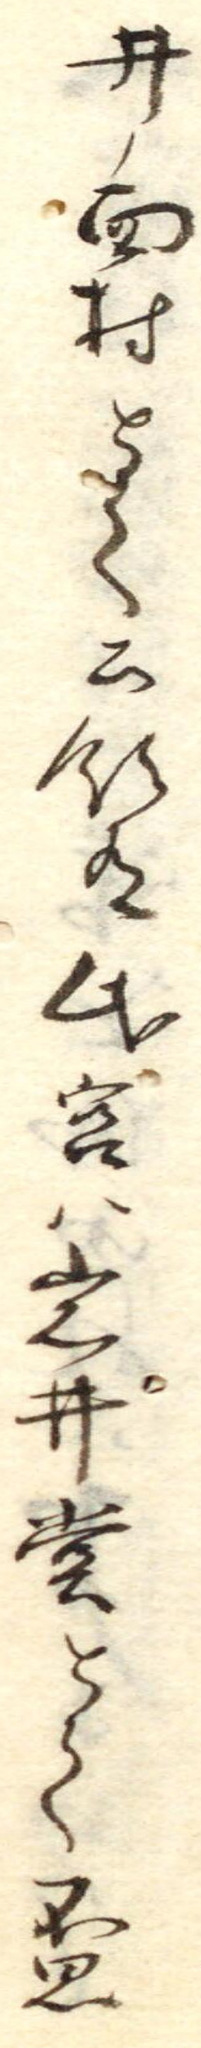井ノ面村とて公領有氏宮は岩井堂とて不思
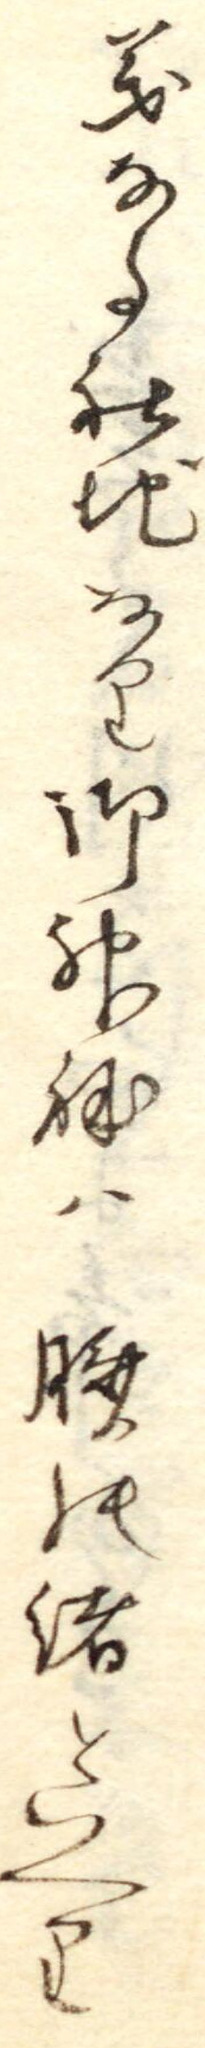義なる社地なり御神躰は臍の緒といへり
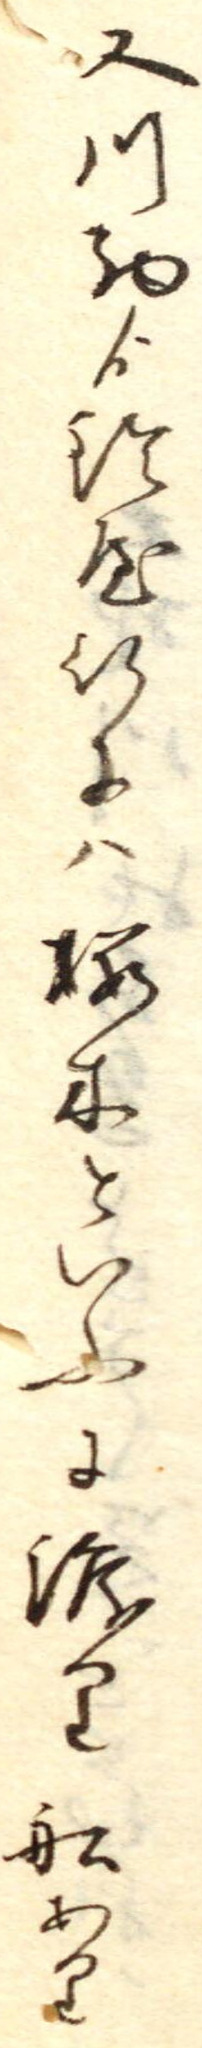又川西ゟ鈴屋行には桜木といふに渡り船あり
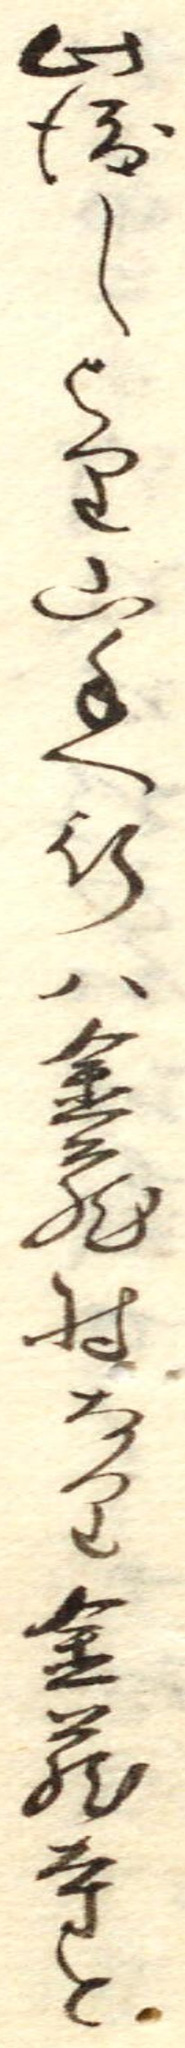此渡しより山手へ行は金蔵村なり金蔵寺と
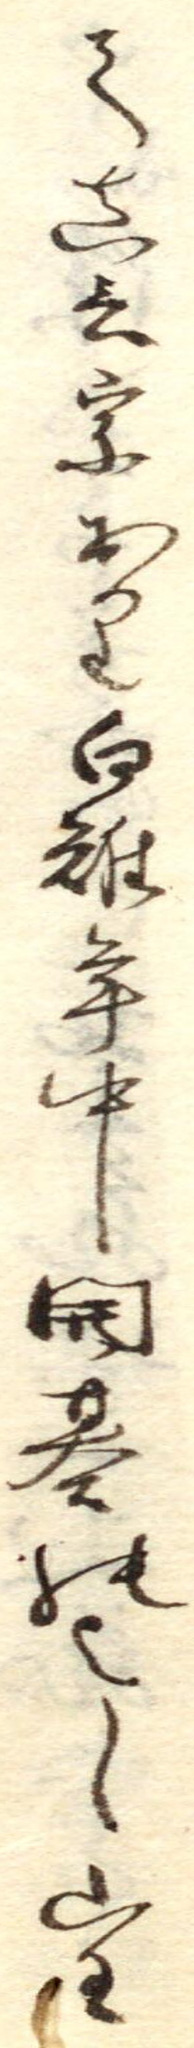て真言宗あり白雉年中開基のよし山王
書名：能登名跡誌
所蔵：Ishikawa Prefectural Library
